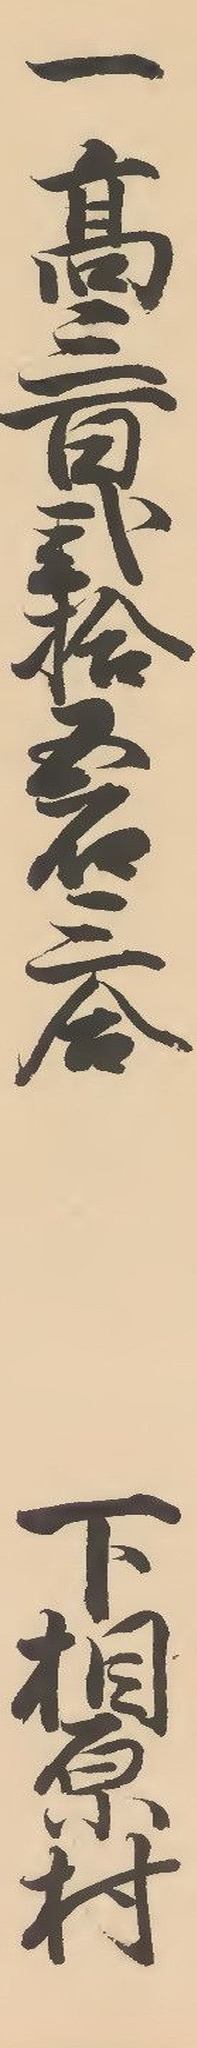一高三百弐拾五石三合下相原村
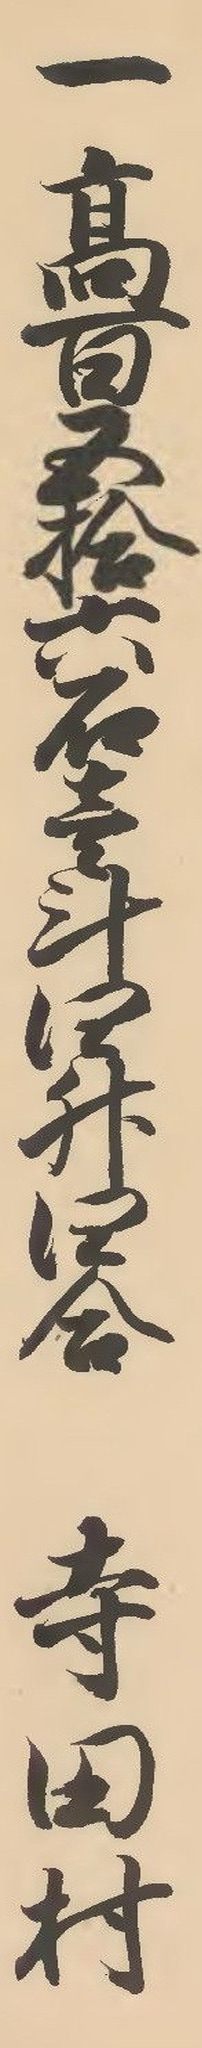一高百五拾六石壱斗四升四合寺田村
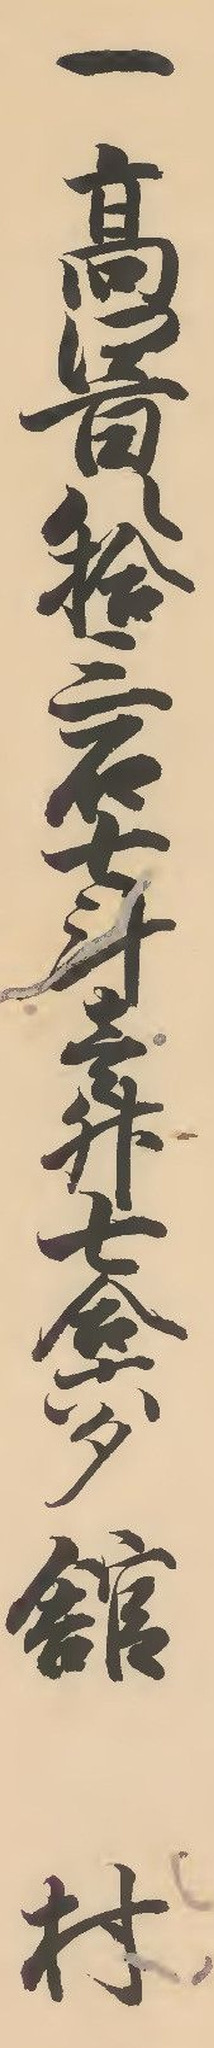一高四百八拾三石七斗壱升七合六勺館村

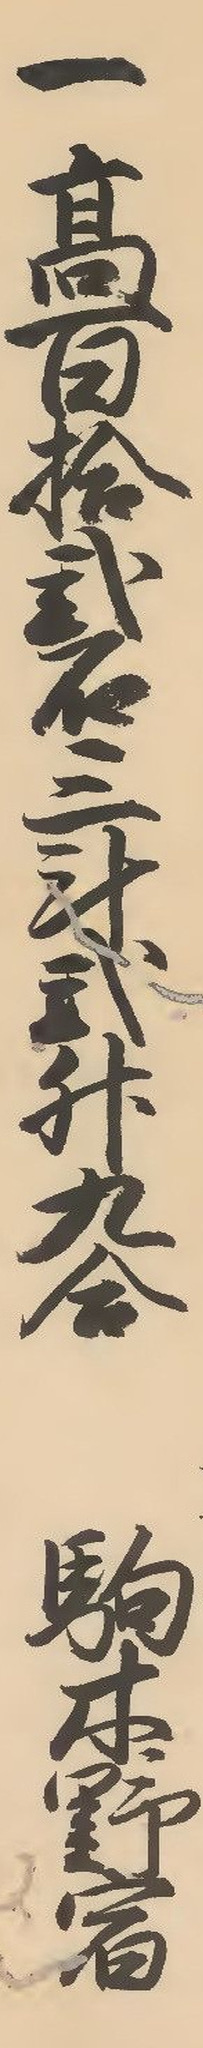一高百拾弐石三斗弐升九合駒木野宿
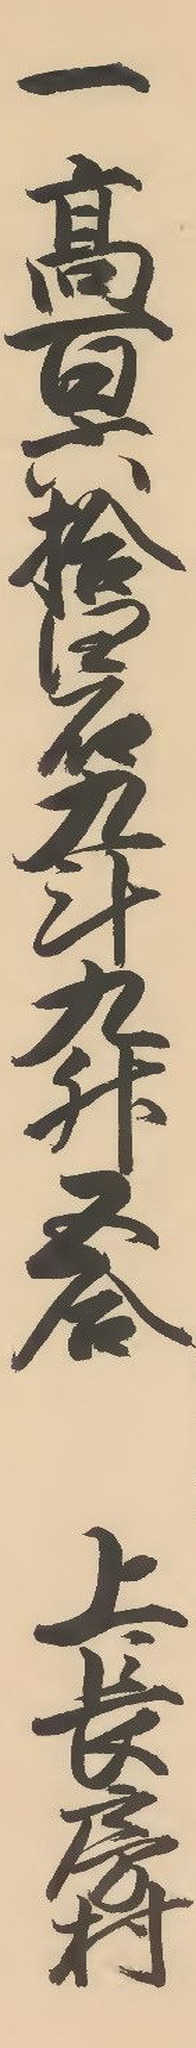一高百六拾四石九斗九升五合上長房村
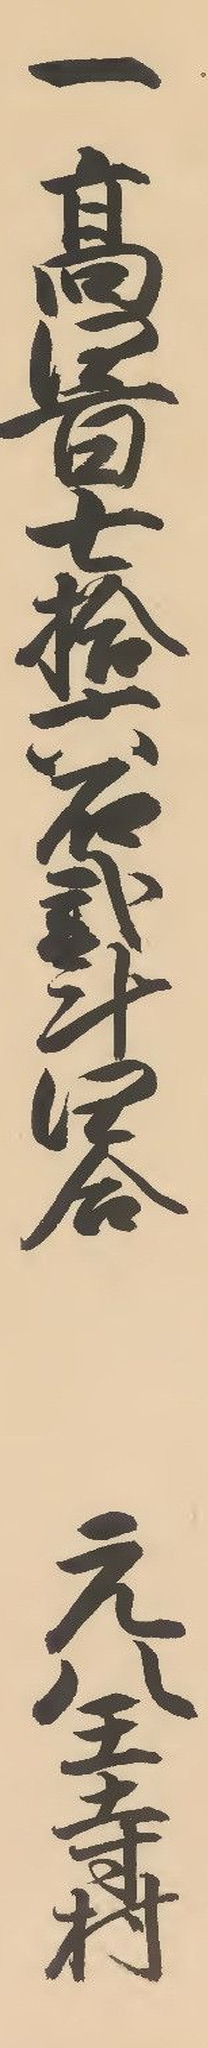一高四百七拾六石弐斗四合元八王寺村
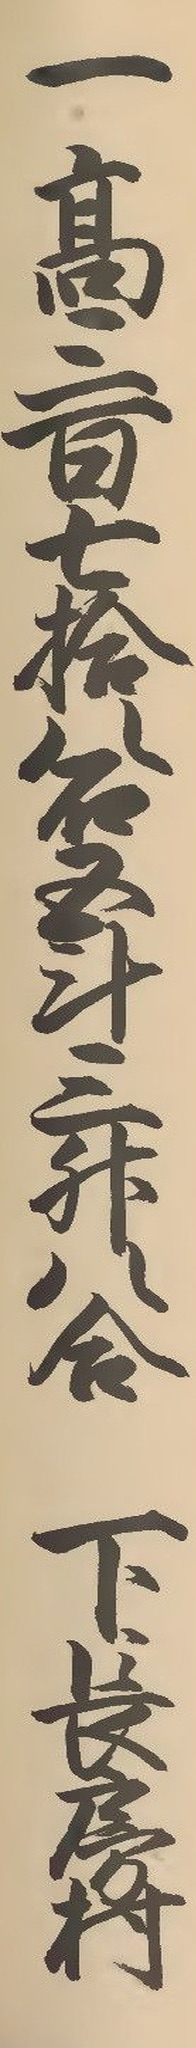一高三百七拾八石五斗三升八合下長房村
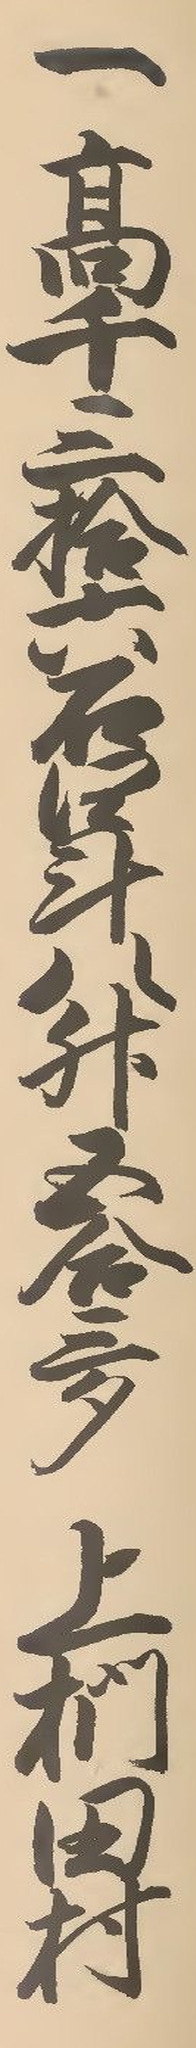一高千三拾六石四斗八升五合三勺上椚田村
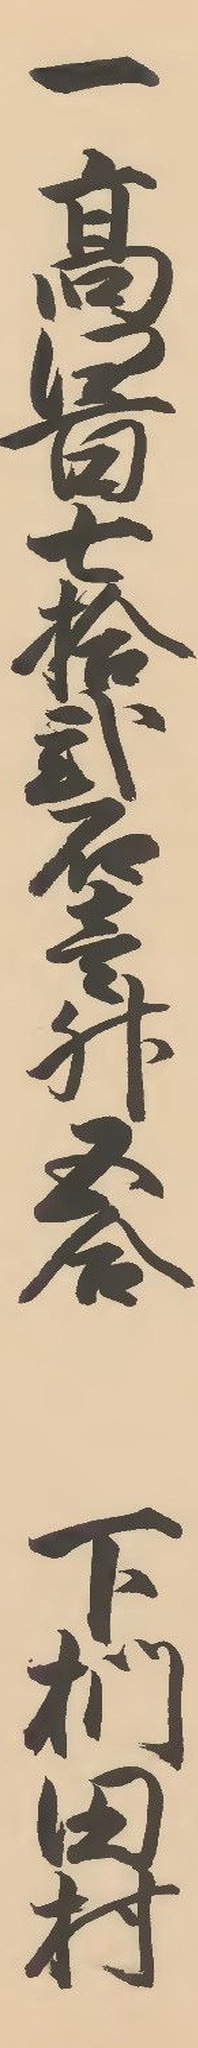一高四百七拾弐石壱升五合下椚田村
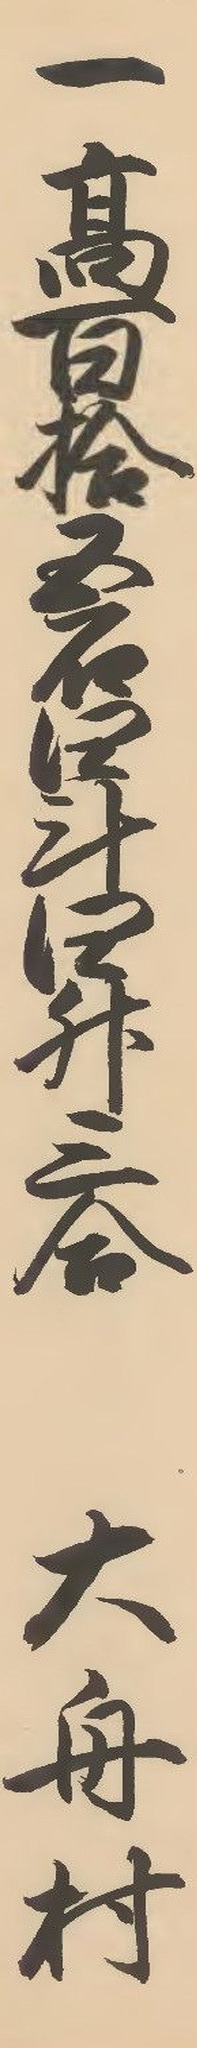一高百拾五石四斗四升三合大舟村
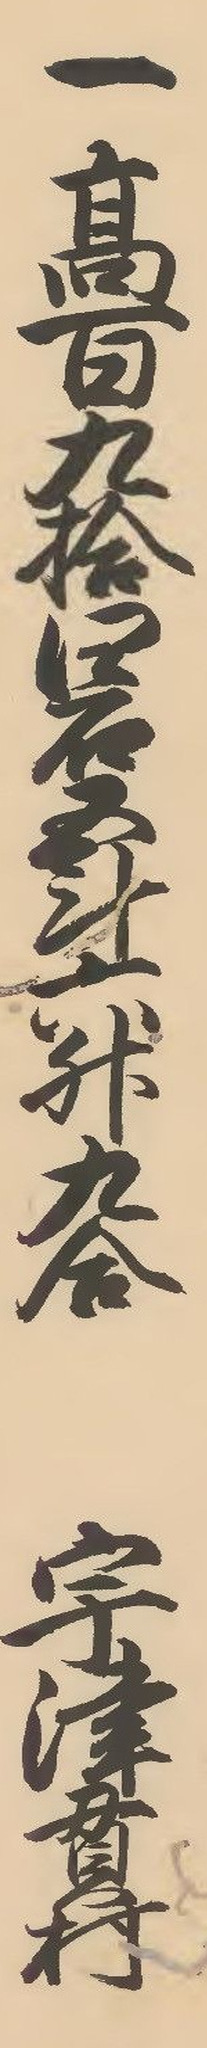一高百九拾四石五斗六升九合宇津貫村

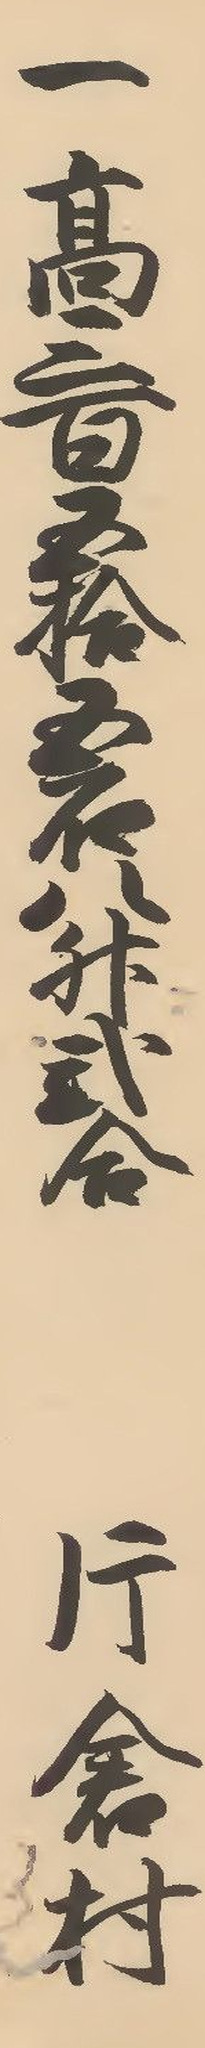一高三百五拾五石八升弐合片倉村
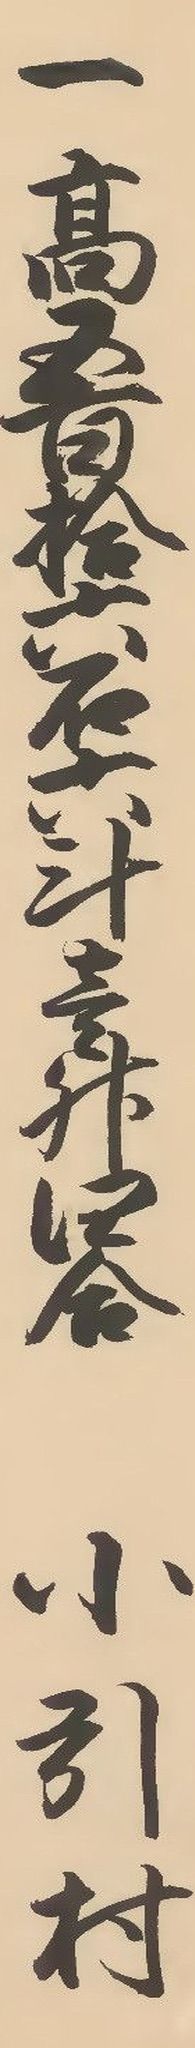一高五百拾六石六斗壱升四合小引村
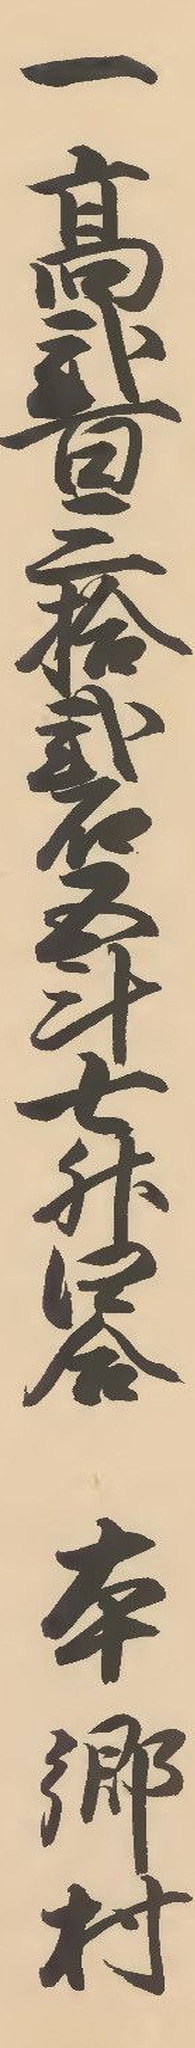一高弐百三拾弐石五斗七升四合本郷村
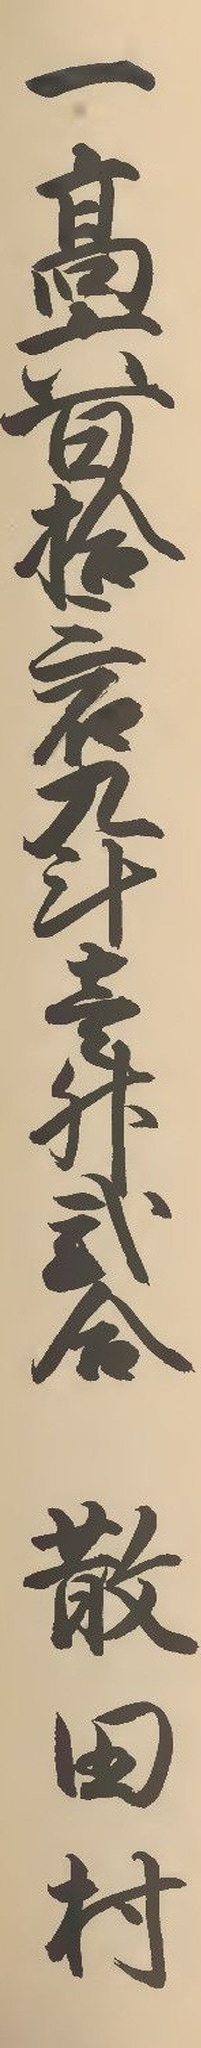一高六百拾三石九斗壱升弐合散田村
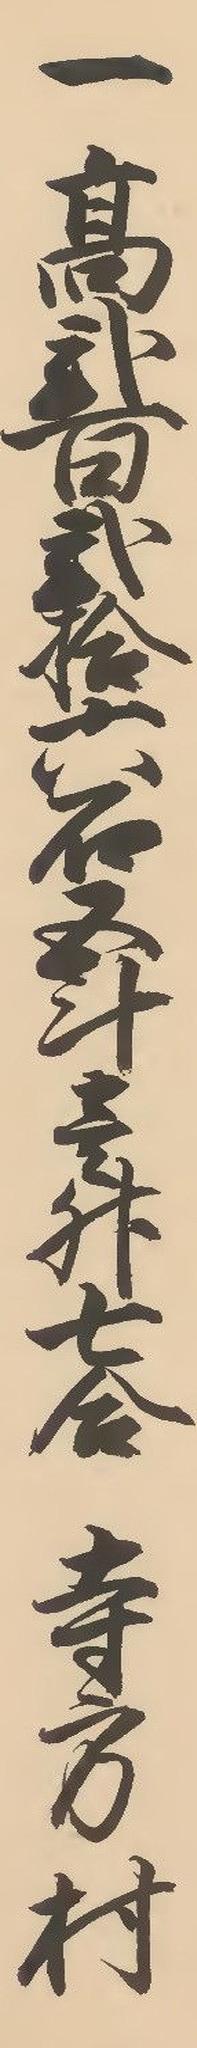一高弐百弐拾六石五斗壱升七合寺方村
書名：武蔵国郷帳　上
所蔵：国立公文書館 National Archives of Japan
